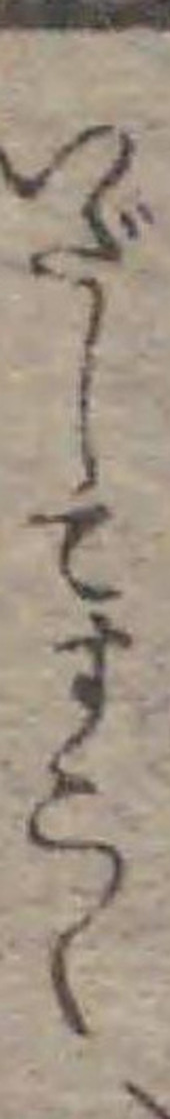いだしてすこく
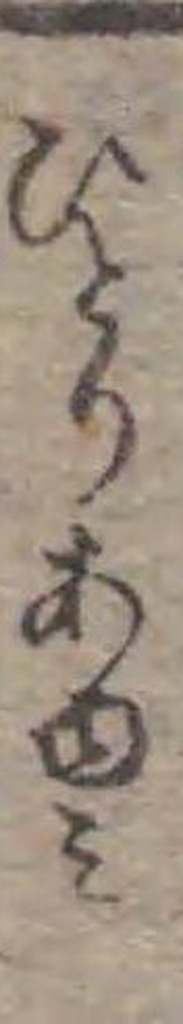ひとりあゆみ
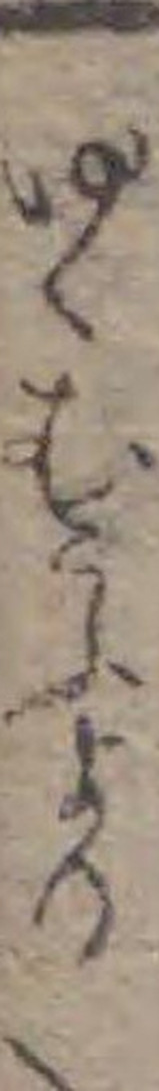ゆくむこふより
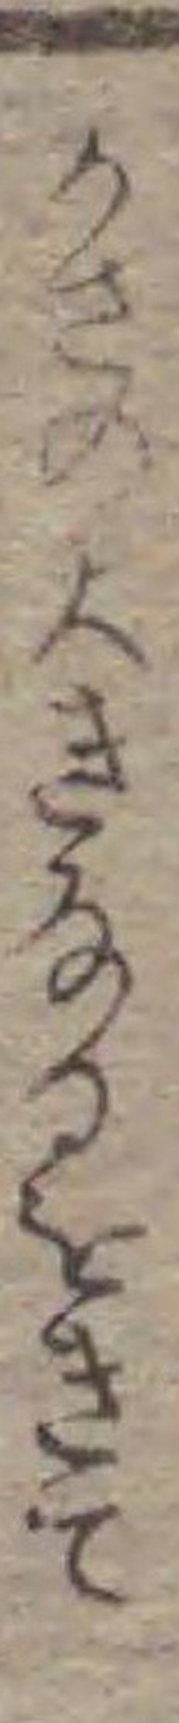かさの大きなるをきて
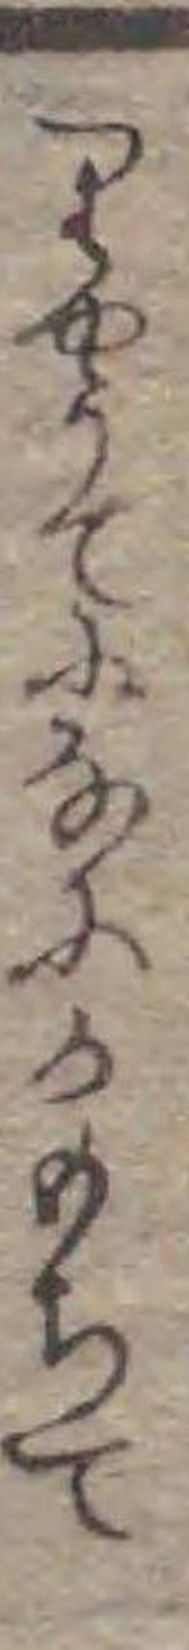りやうてになにかもちて
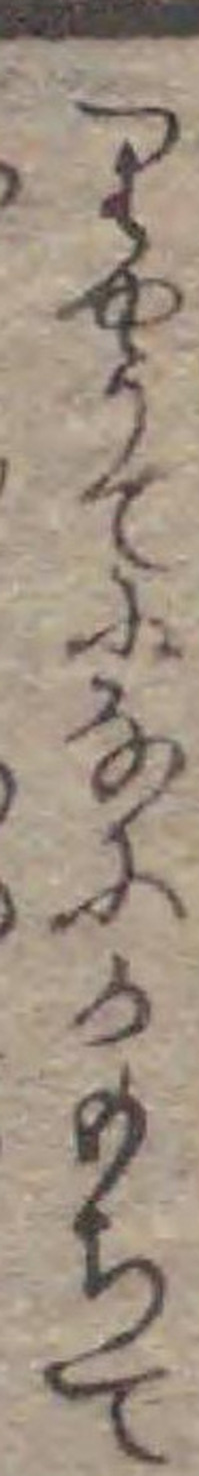りやうてになにかもちて
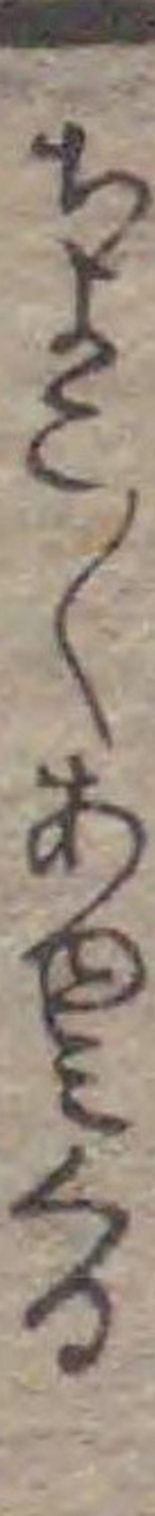ちよこ〳〵あゆみくる
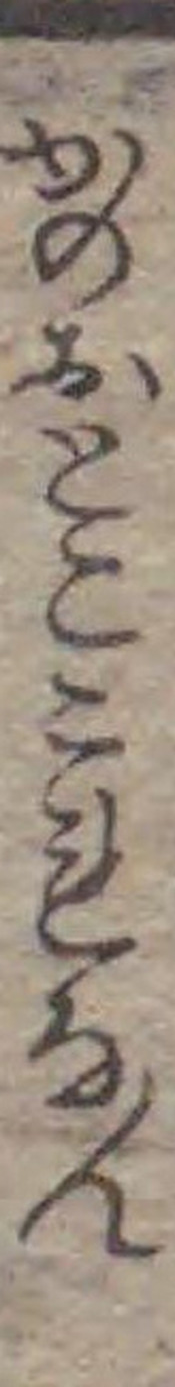かのおとここれなん
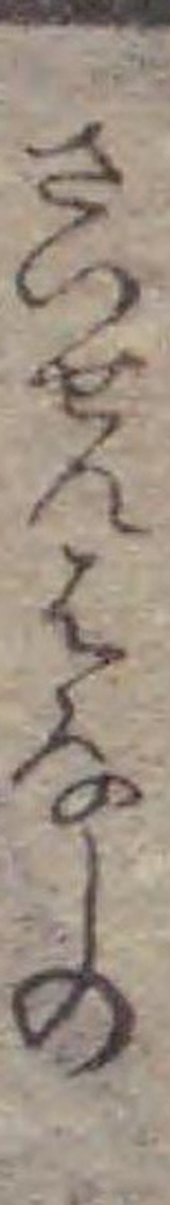さいせんはなしの
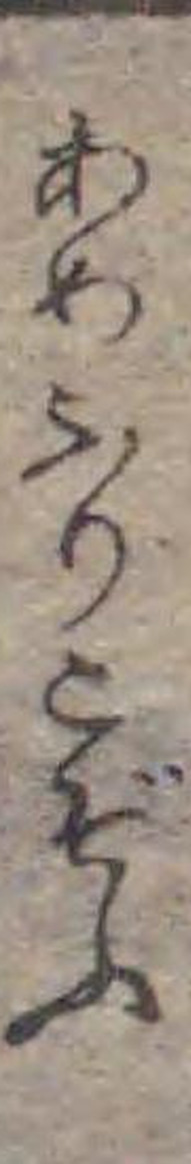あめふりこぞふ
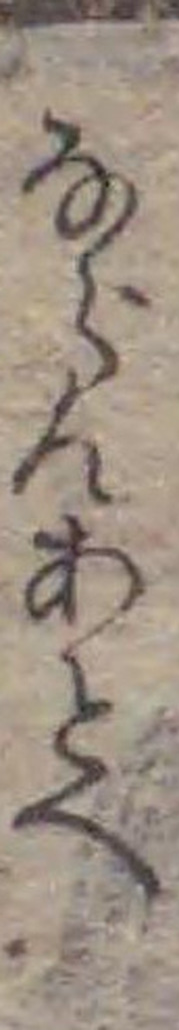ならんあとへ
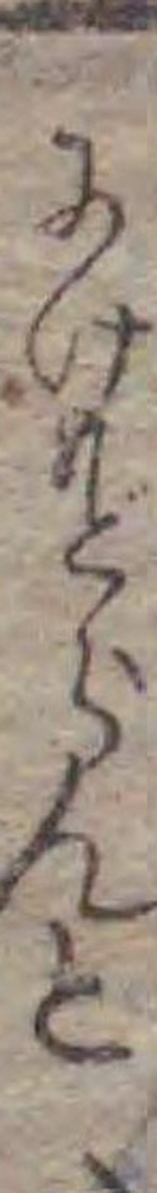にけもどらんと
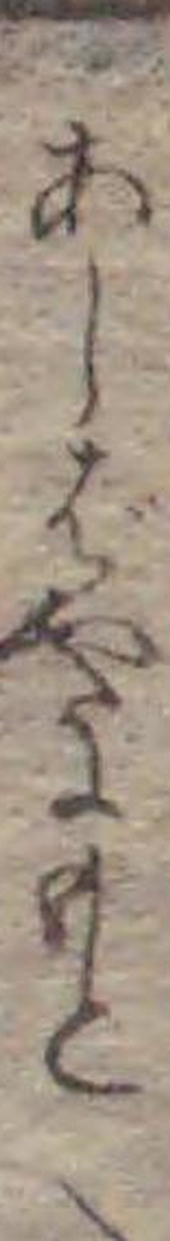あしばやにもと
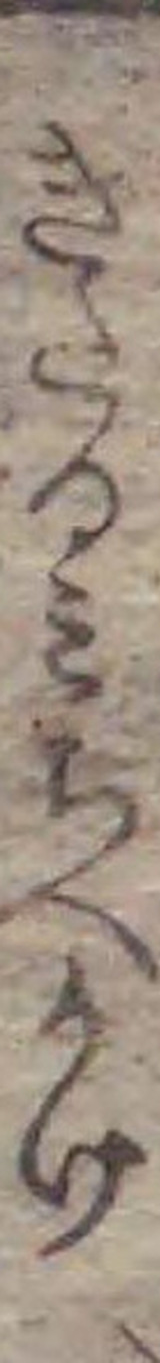きたるみちへかけ
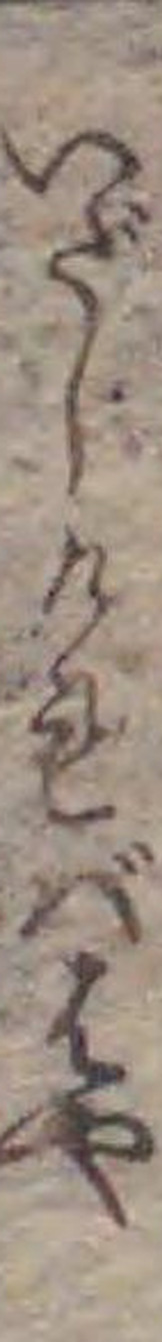いだしければはや
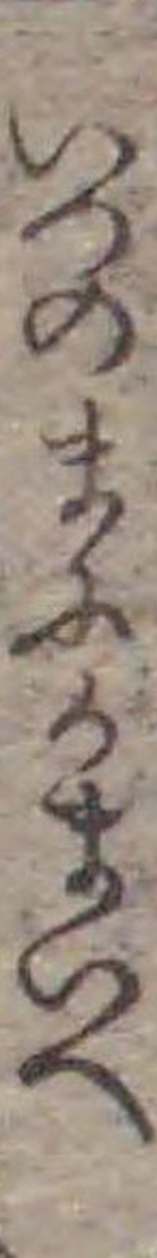いつのまにかまいへ
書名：変化物春遊 : 2巻
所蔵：国立国会図書館 National Diet Library, JAPAN
